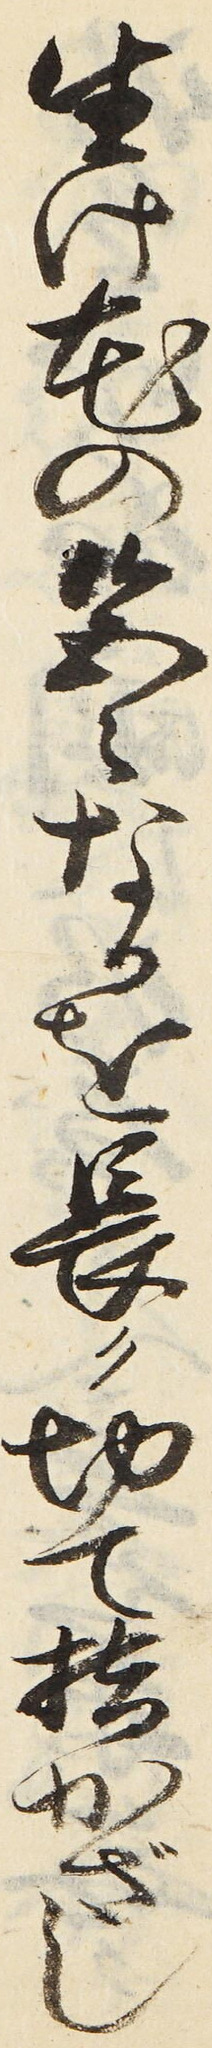生け花の色々なるを長く切て指かざし
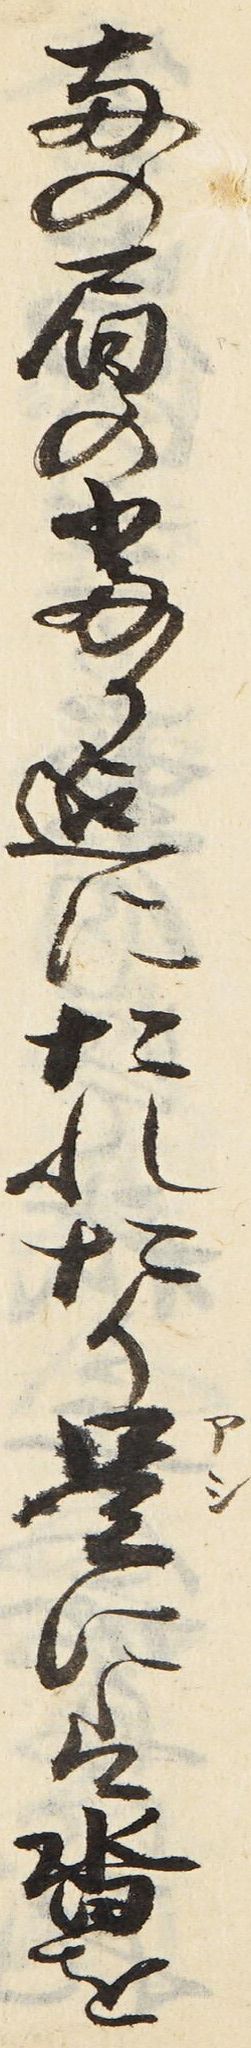両の肩の当り迠にたれたり足には沓を
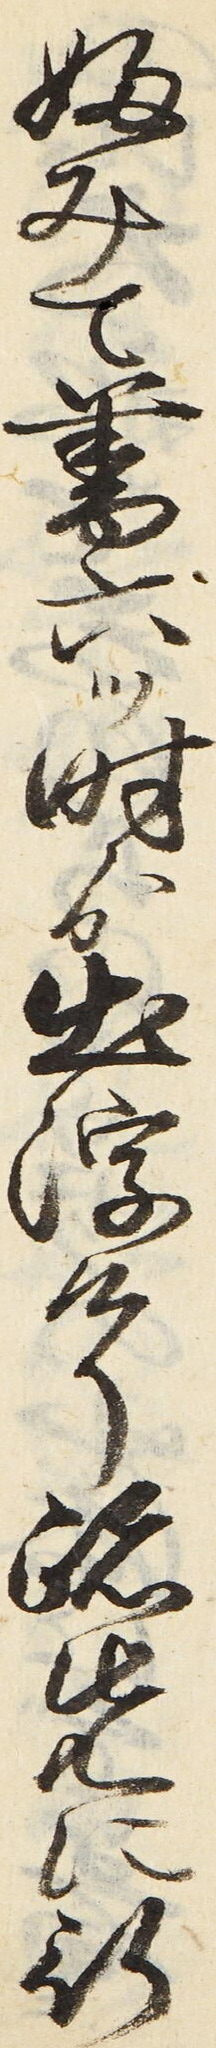ふみて暮六つ時ゟ出浮けり跡先に行
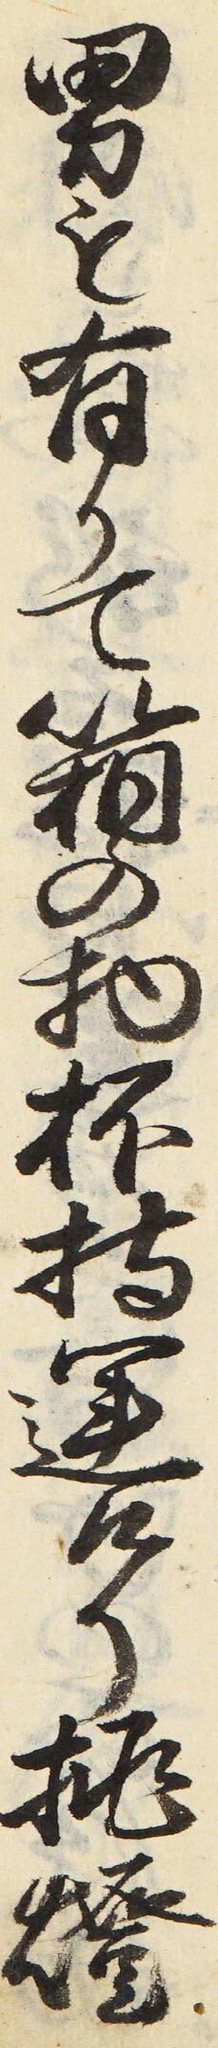男も有りて箱の物抔持運けり挑燈
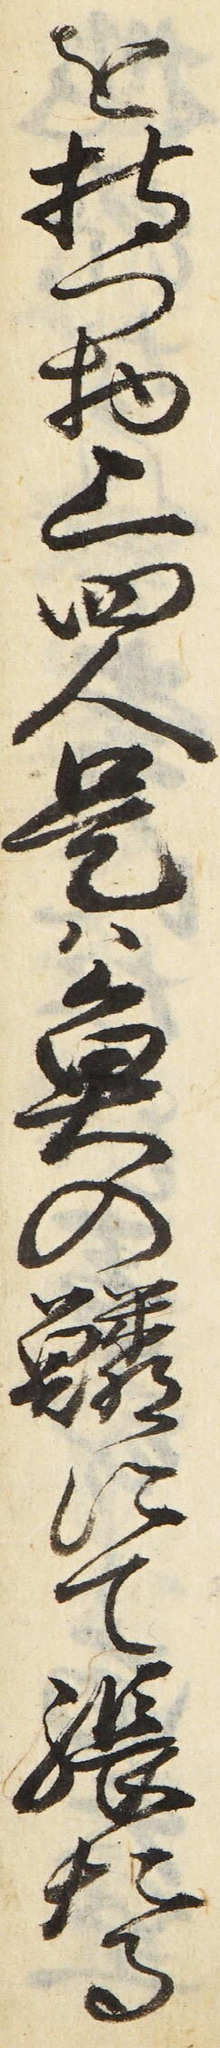を持つ物三四人是は魚の鱗にて張たる

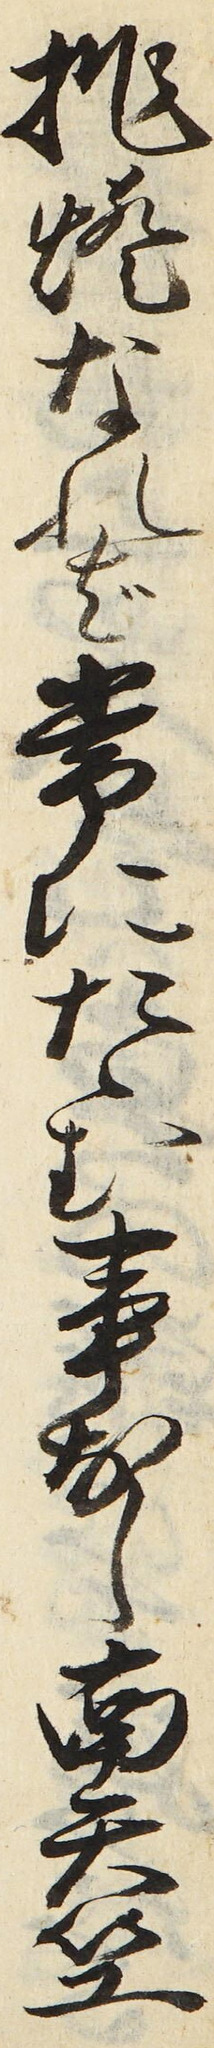挑燈なれば常にたゝむ事なし南天竺
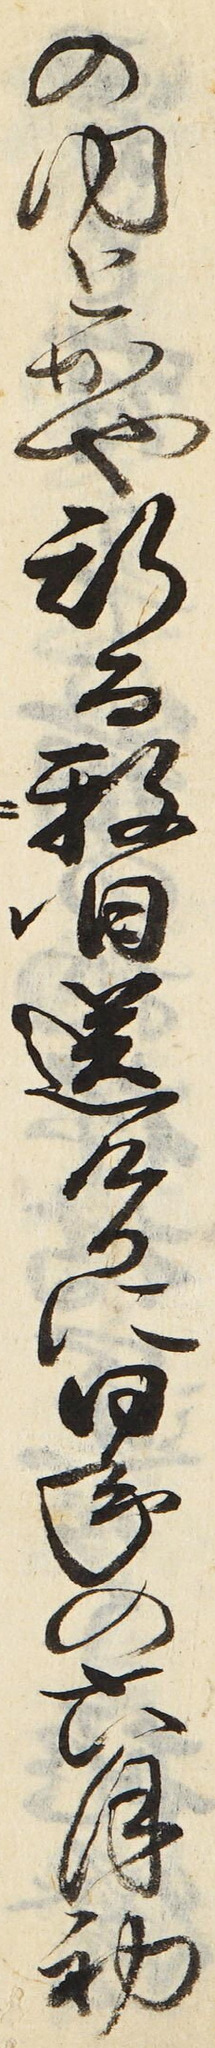の内とかや斯而数日送けるに同年の六月初
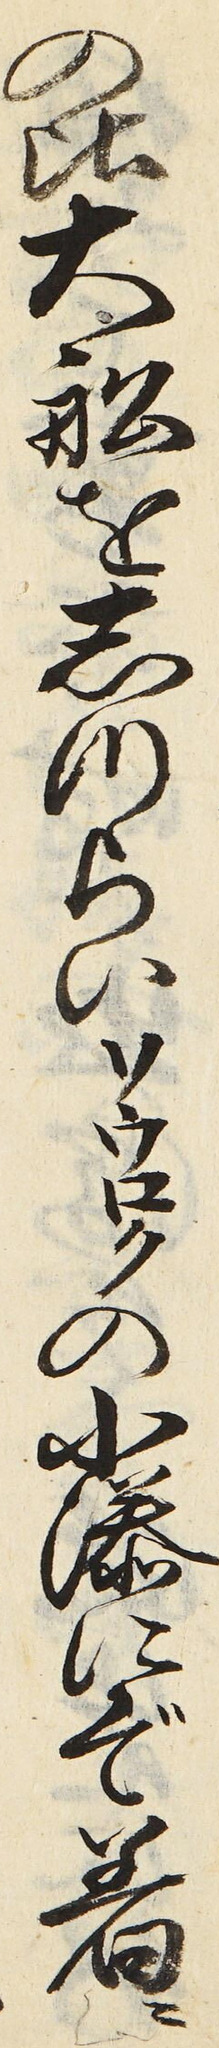の頃大船をしつらいソウロクの小湊にぞ着に
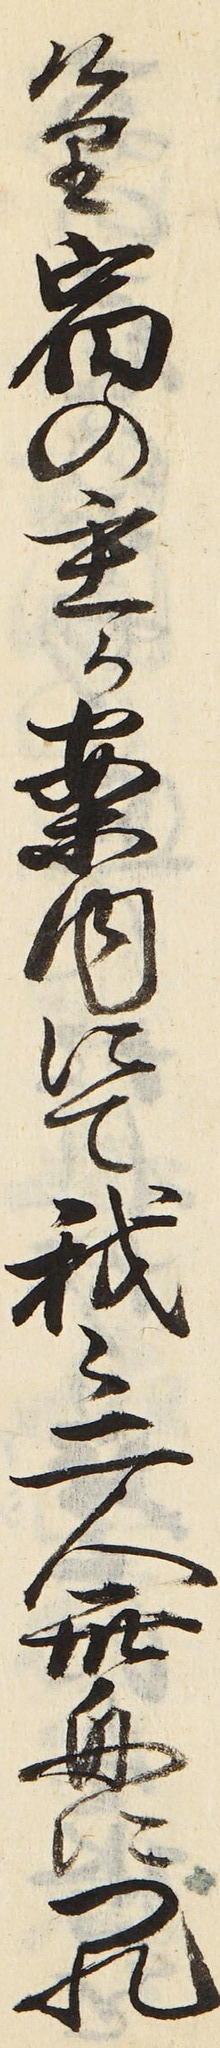けり宿の主か案内にて我々二人此舟につれ
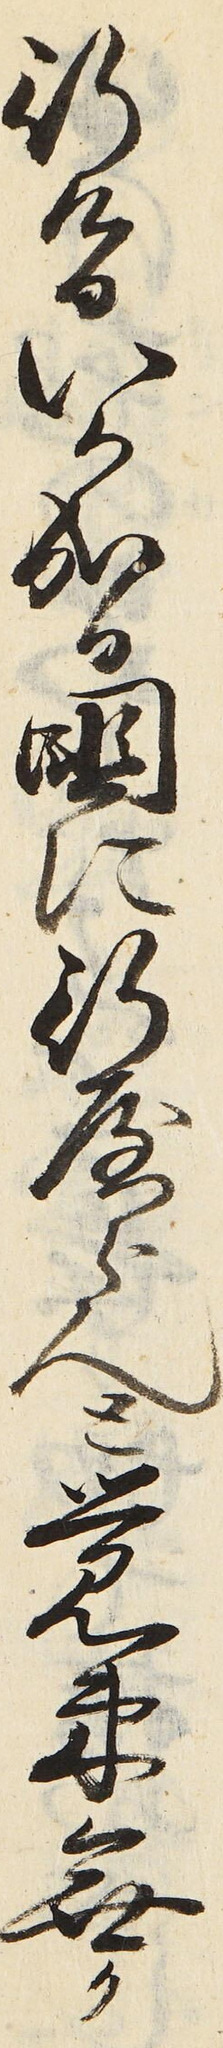行けるいか成る国に行やらんと覚束無く
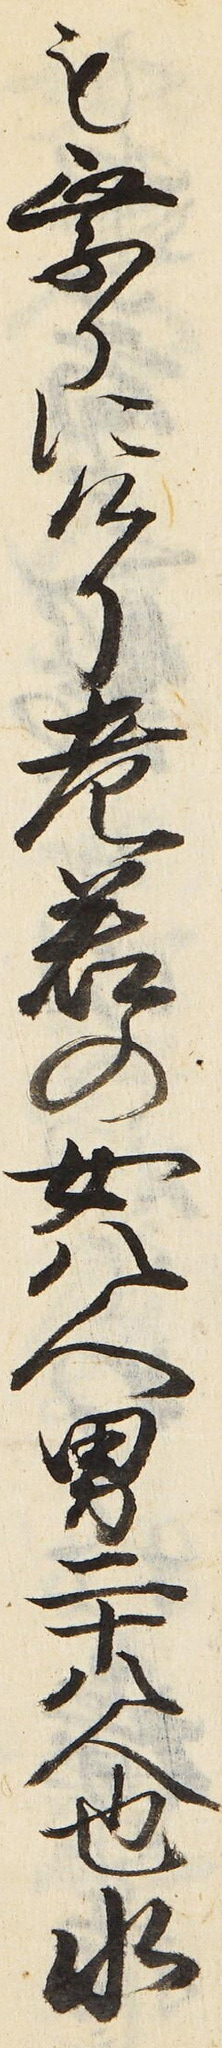も乗りにけり老若の女八人男二十八人也水
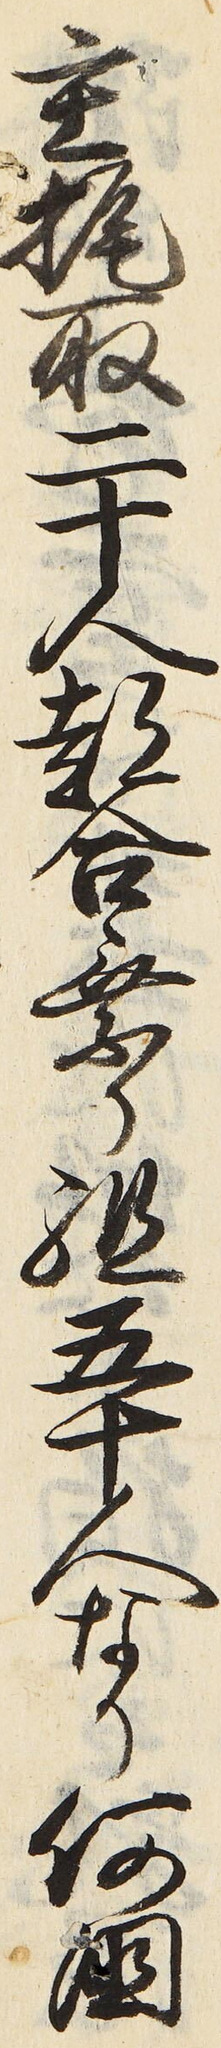主梶取二十人都合乗り組五十人なり何国
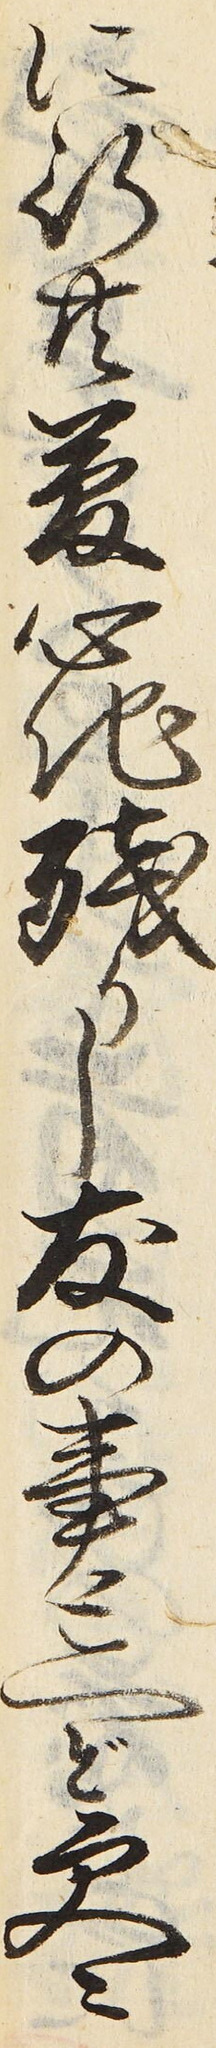に行共夢心地残りし友の事とへど更に
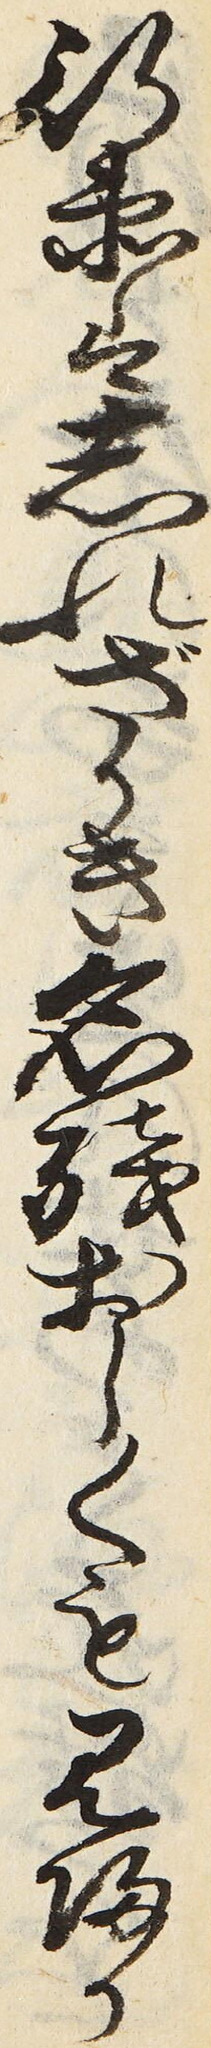行えはしれざりき名残おしくも見帰り
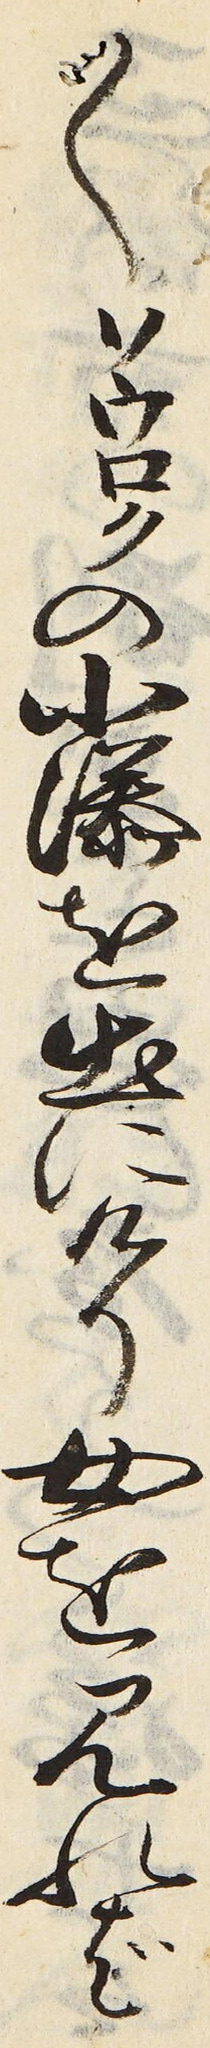〳〵ソウロクの小湊を出にけり女を見れば
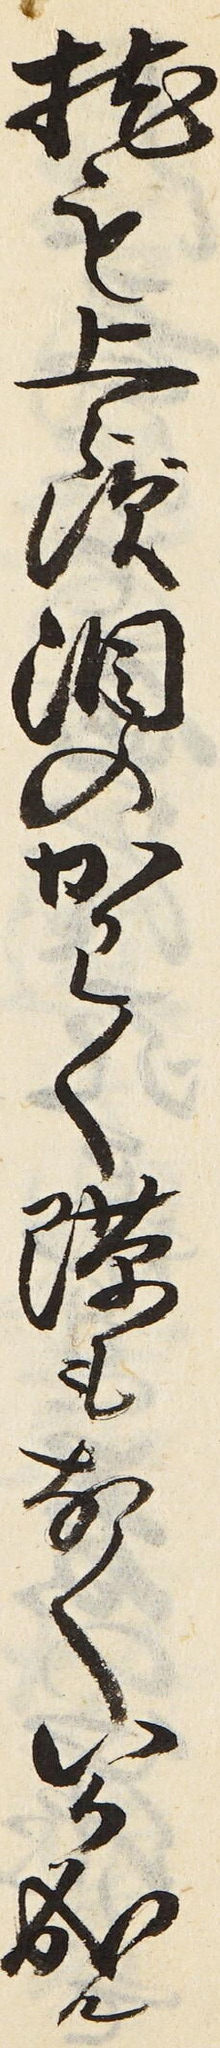枕も上らず泪のかわく隙もなくいか成る
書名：華夷九年録
